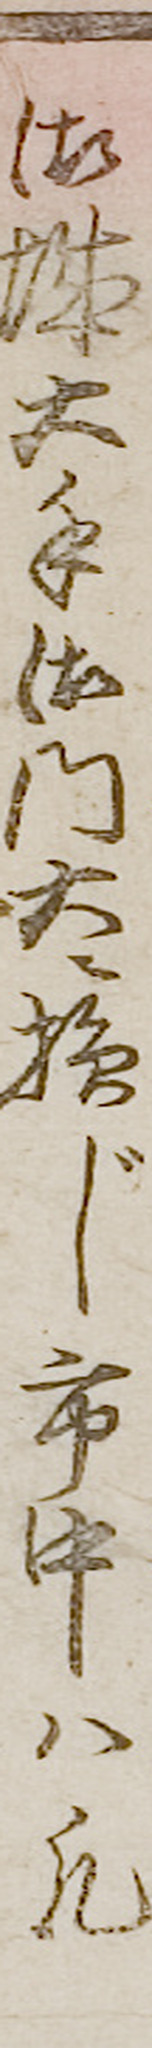御城大手御門大に損じ市中は凡
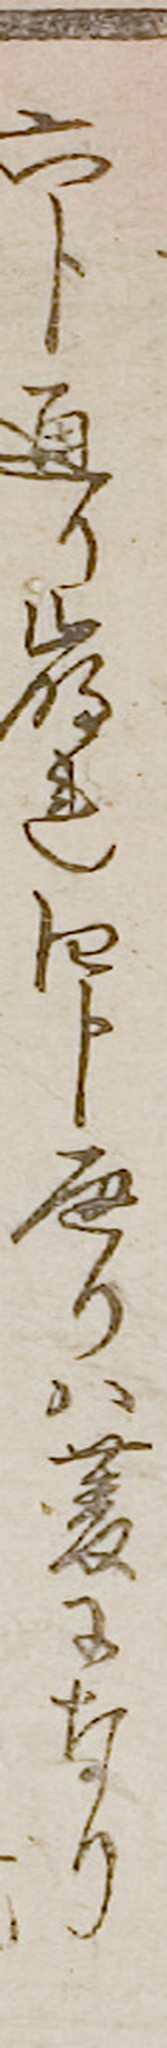六分通り崩れ四分通りは菱になり
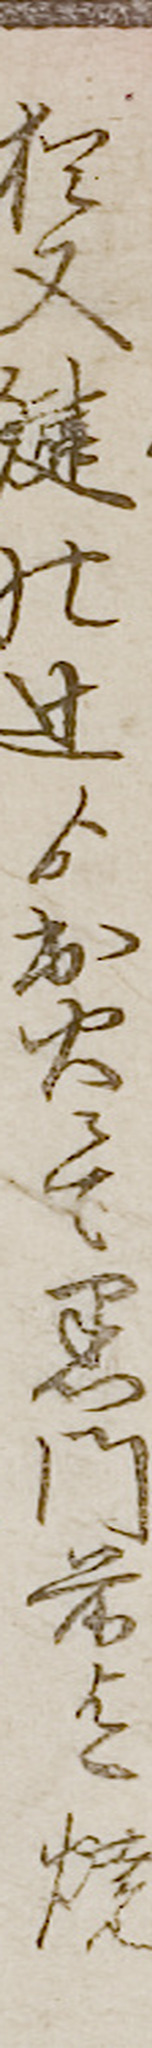猶又鍵の辻より出火にて黒門前迄焼
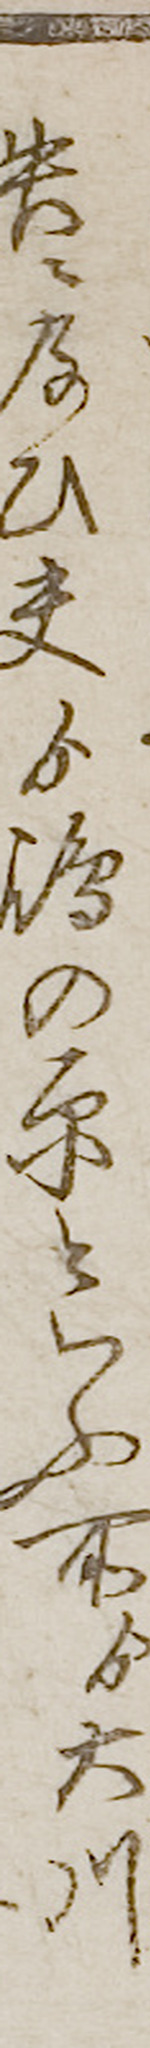失に及ひ夫より嶋の原といふ所より大川
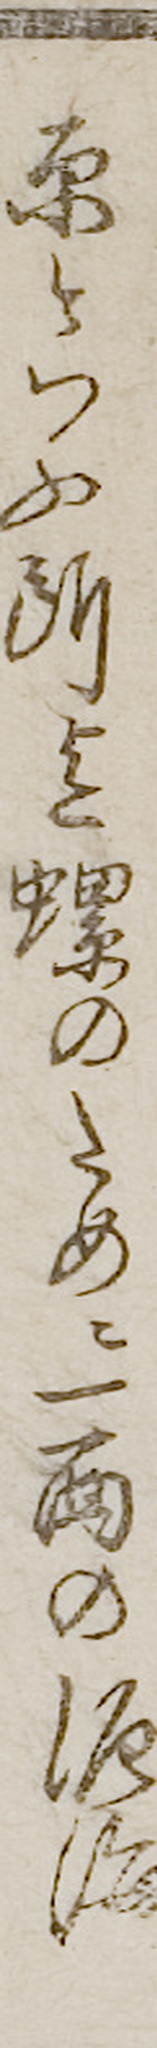原といふ所迄螺のために一面の泥海
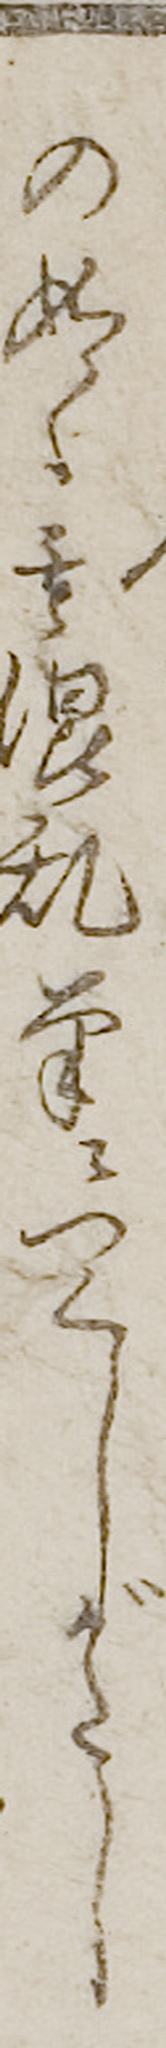の如く其混乱筆につくしがたし
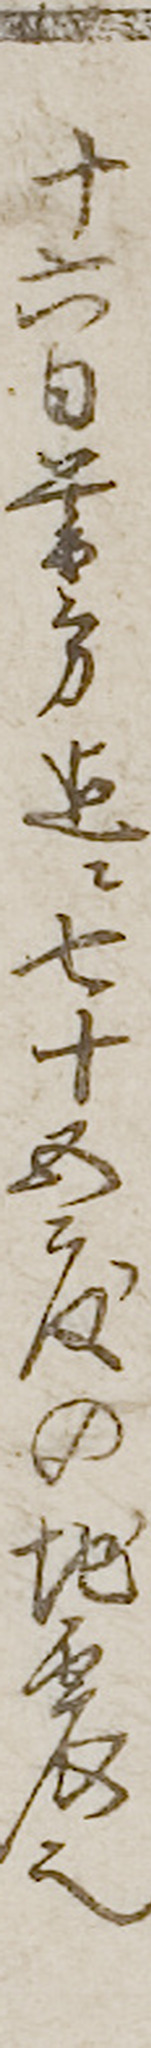十六日暮方迄に七十五度の地震也
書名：聞書諸国大地震并出火
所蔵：東京大学総合図書館 General Library in the University of Tokyo, JAPAN
